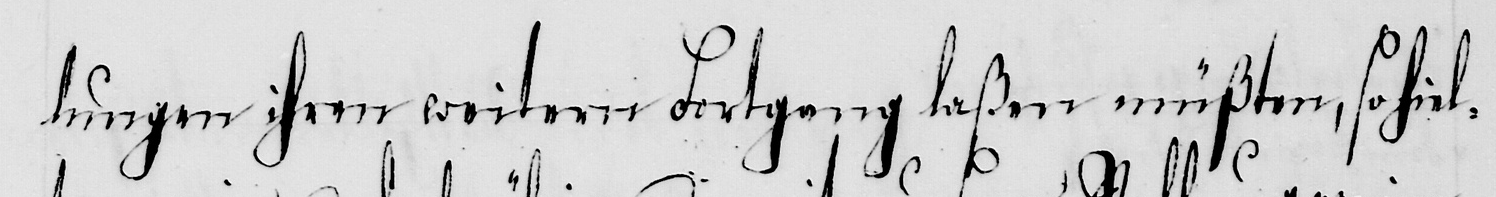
lungen ihren weitern Fortgang laßen müßten, so hi¬
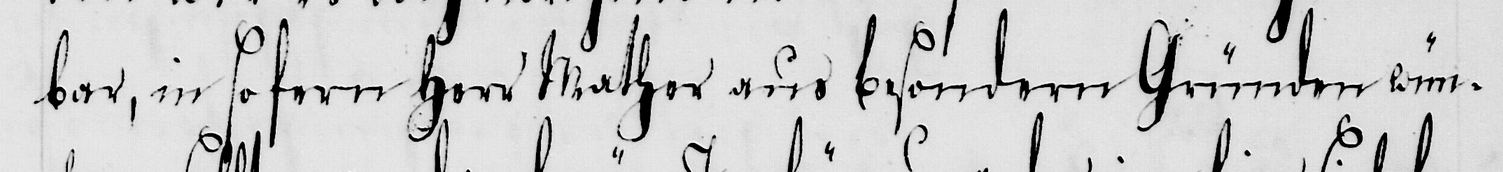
bar, in so fern Herr Mather aus besondern Gründen wüns¬
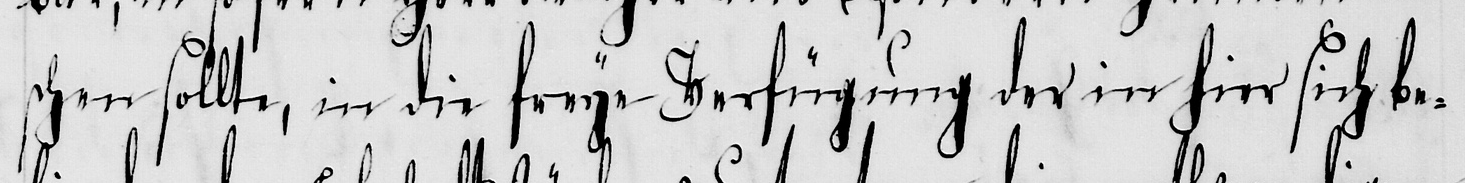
chen sollte, in die freye Verfügung der in hier sich be¬
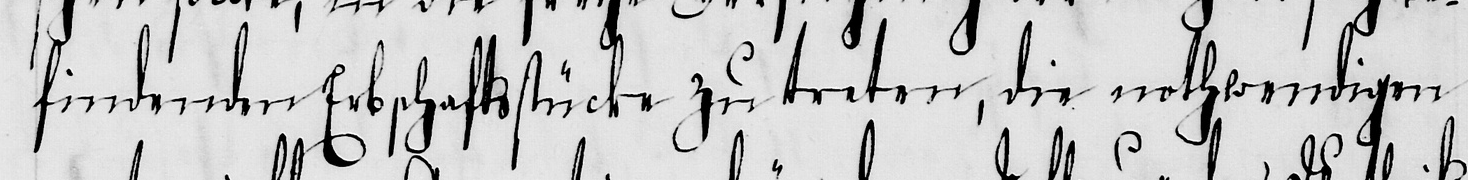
findenden Erbschaftsstücke zu treten, die nothwendigen
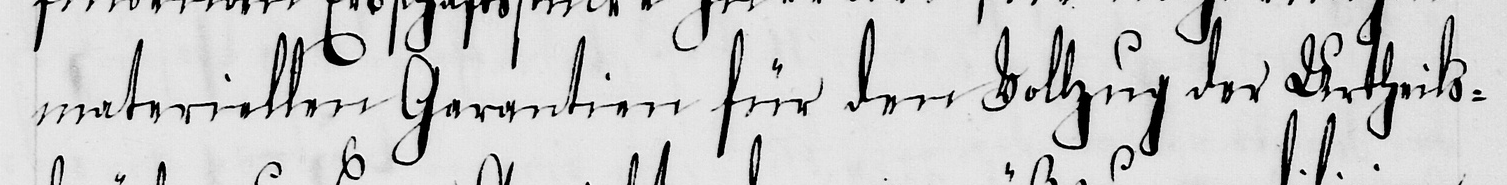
materiellen Garantien für den Vollzug der Urtheils¬
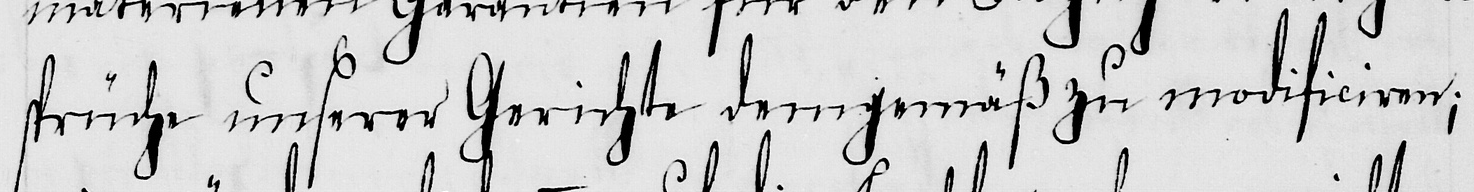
sprüche unserer Gerichte demgemäß zu modificiren;
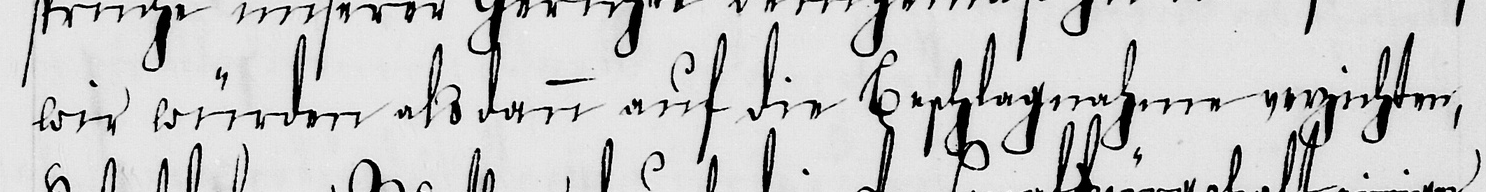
wir würden alsdann auf die Beschlagnahme verzichten,
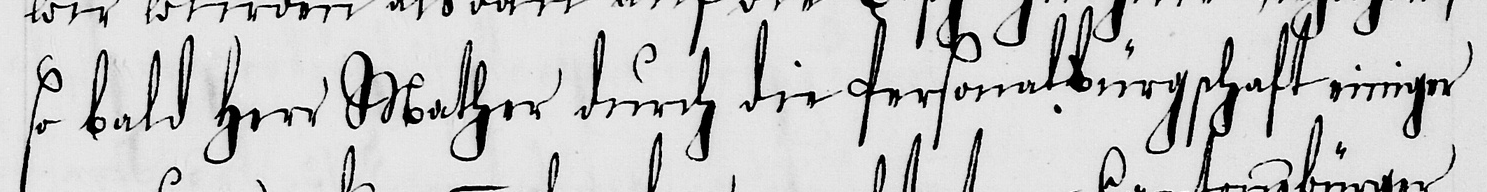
so bald Herr Mather durch die Personalbürgschaft einig¬
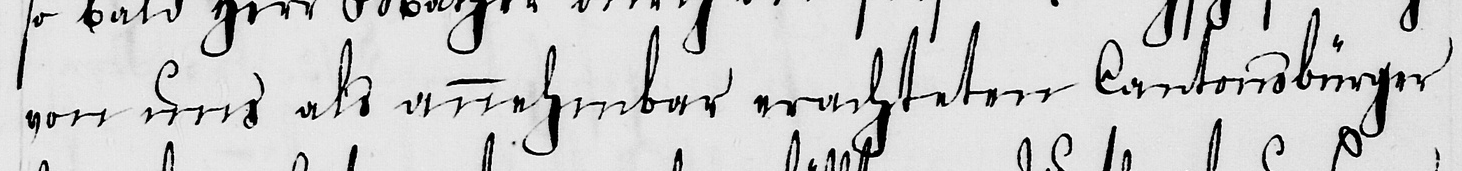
von uns als annehmbar erachteten Cantonsbürger
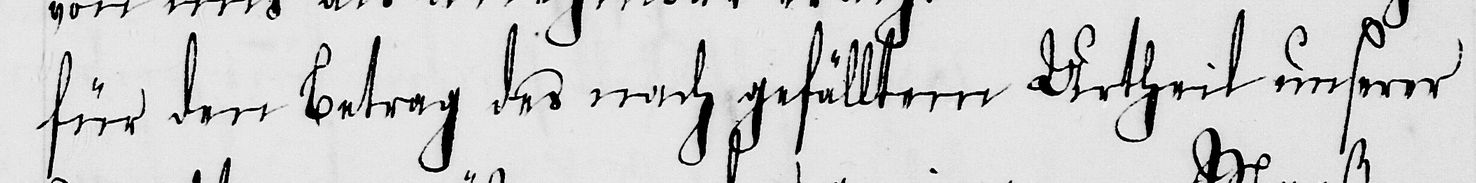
für den Betrag des nach gefälltem Urtheil unserer
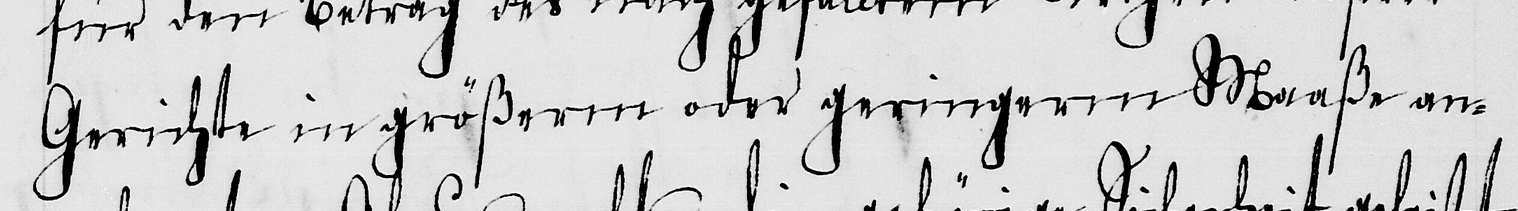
Gerichte in größerm oder geringerm Maaße an¬
